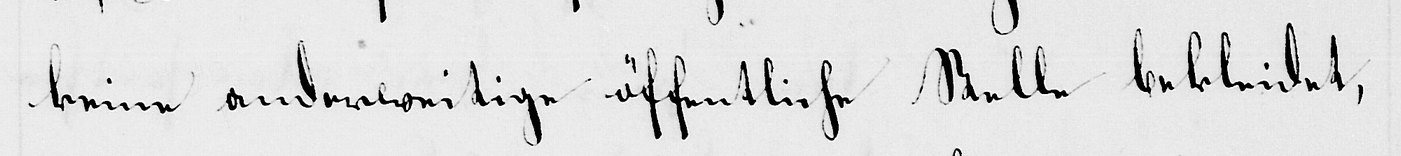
keine anderweitige öffentliche Stelle bekleidet,
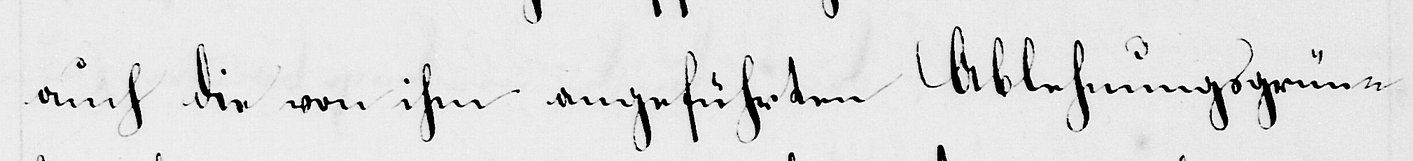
auch die von ihm angeführten Ablehnungsgrün¬
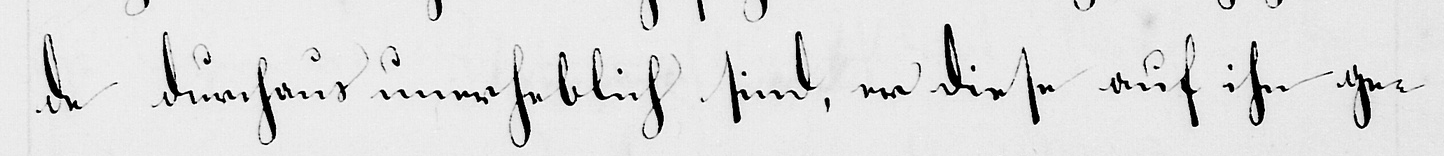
de durchaus unerheblich sind, er diese auf ihn ge¬
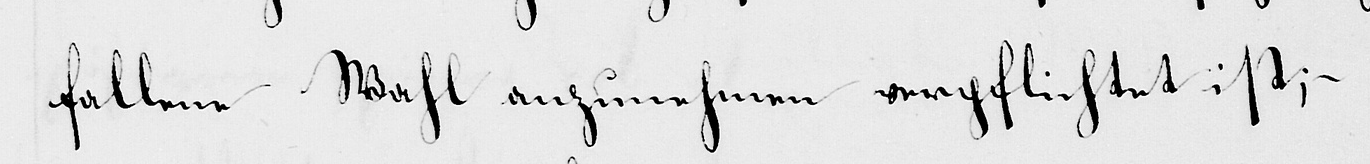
fallene Wahl anzunehmen verpflichtet ist; –
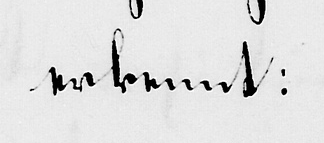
erkannt:
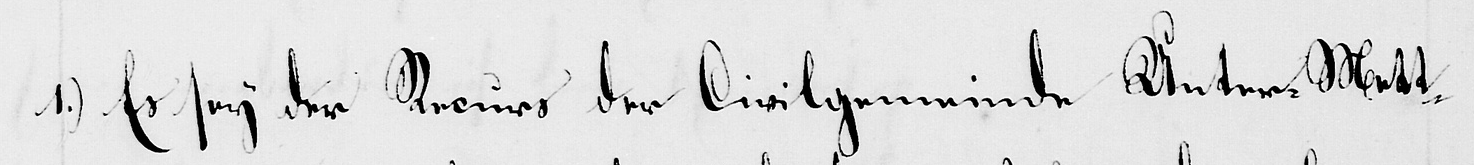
1.) Es sey der Recurs der Civilgemeinde Unter-Mett¬
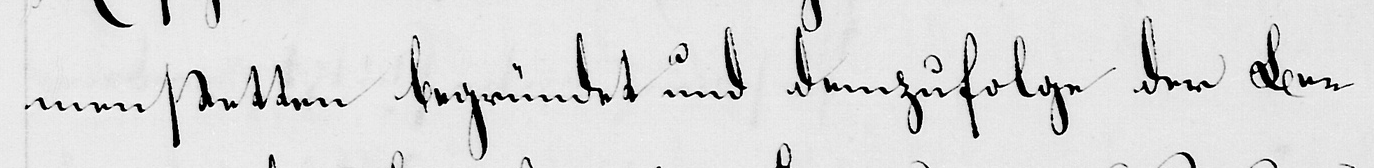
menstetten begründet und demzufolge der Be¬
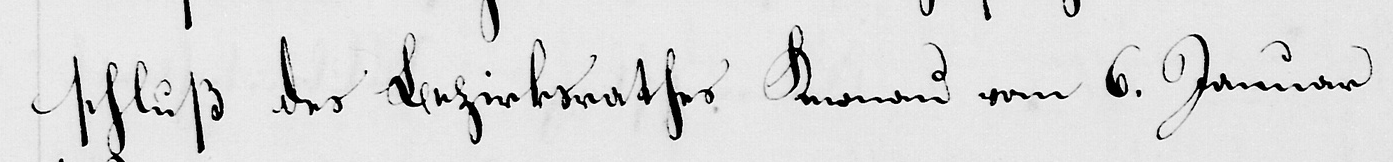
schluß des Bezirksrathes Knonau vom 6. Januar
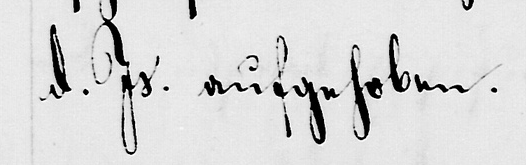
d. Js. aufgehoben.
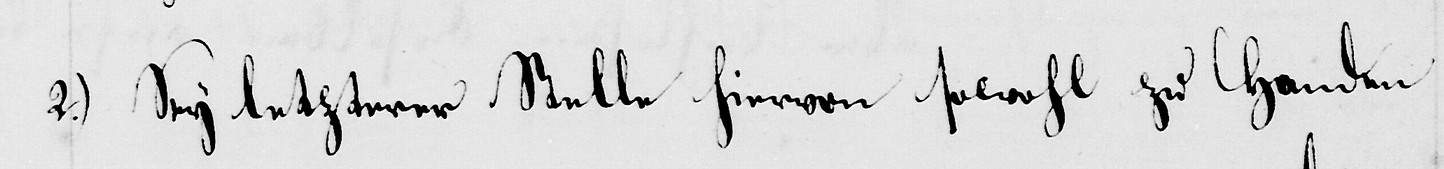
2.) Sey letzterer Stelle hiervon sowohl zu Handen
